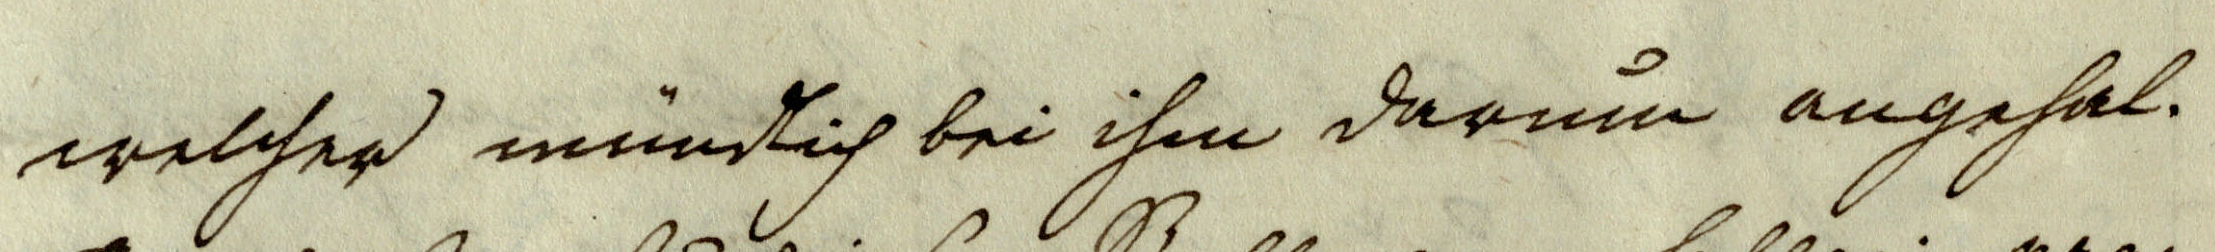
welcher mündlich bei ihm darum angehal¬
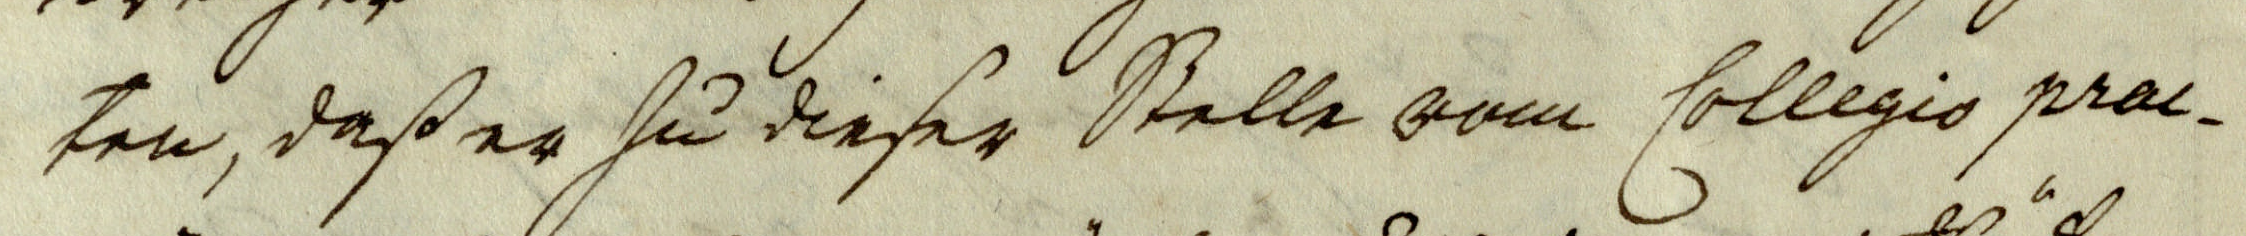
ten, daß er zu dieser Stelle vom Collegio prae¬
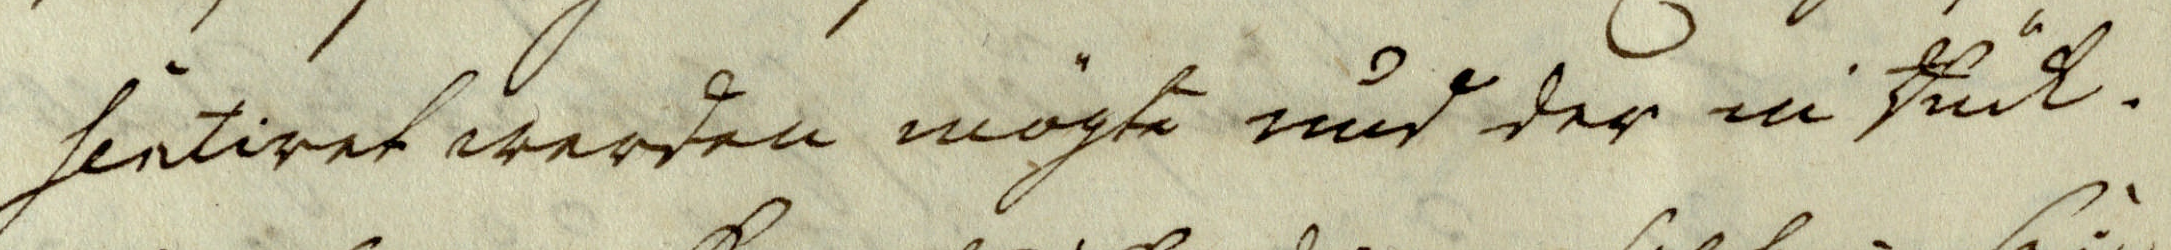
sentiret werden mögte und der in Rück¬
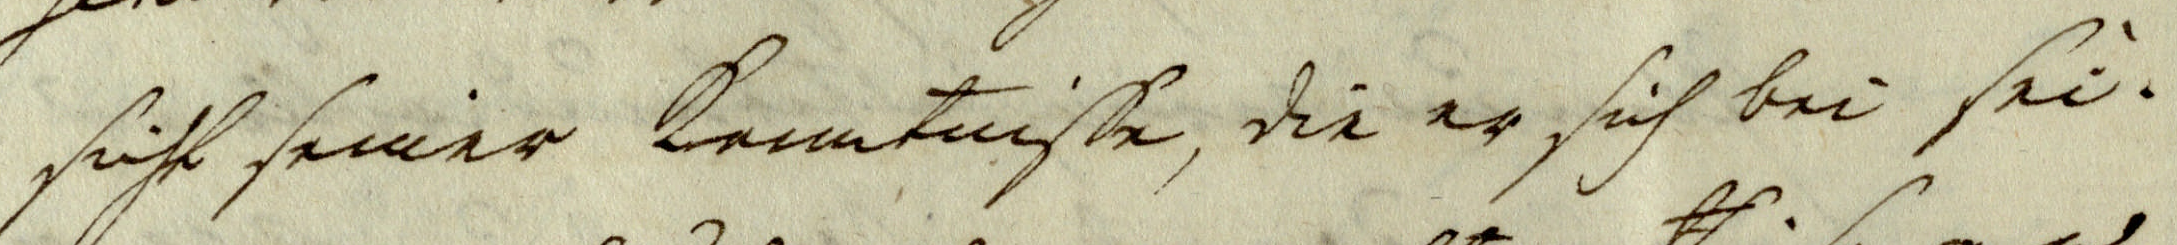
sicht seiner Kenntnisse, die er sich bei sei¬
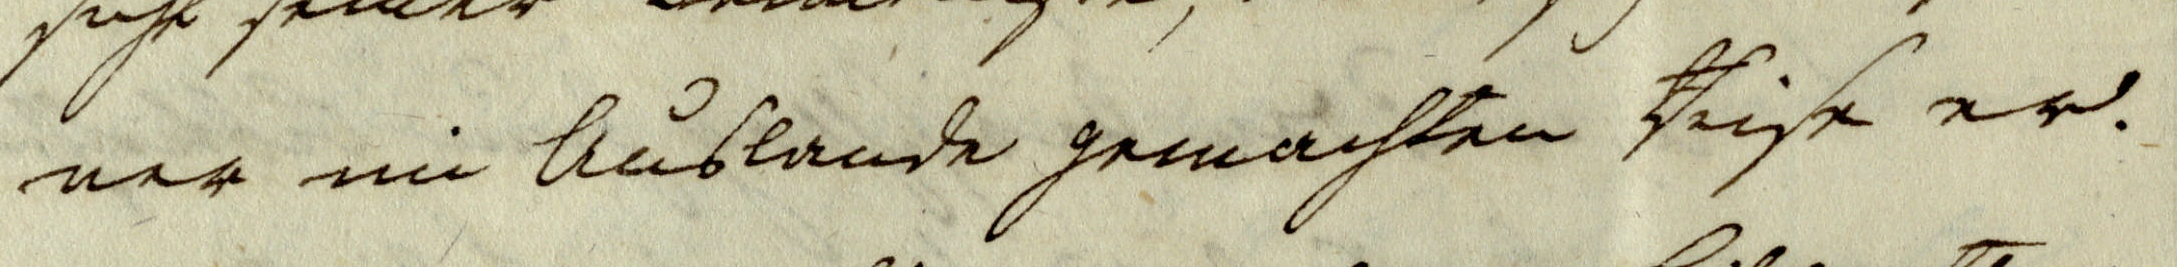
ner im Auslande gemachten Reise er¬
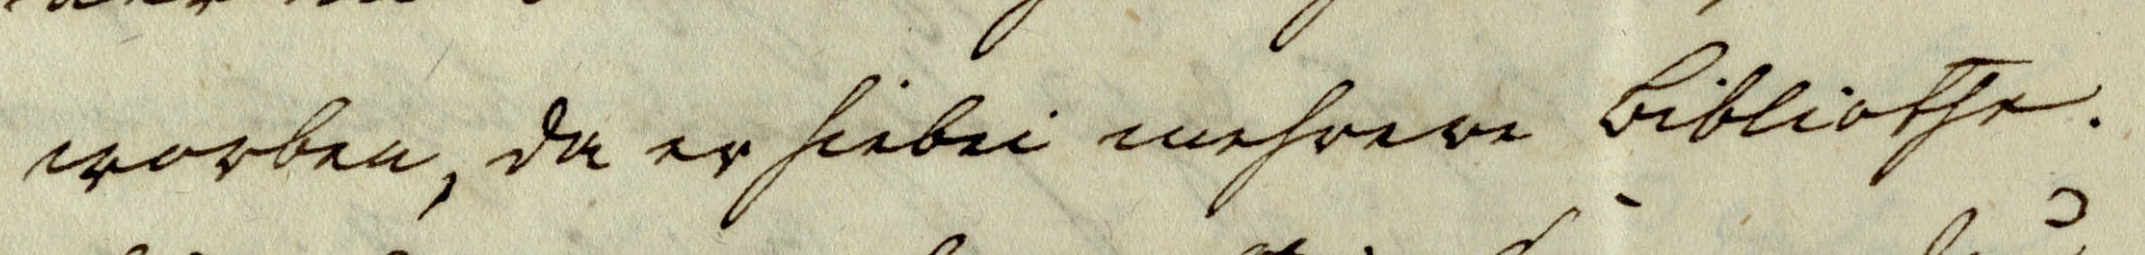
worben, da er hiebei mehrere Bibliothe¬
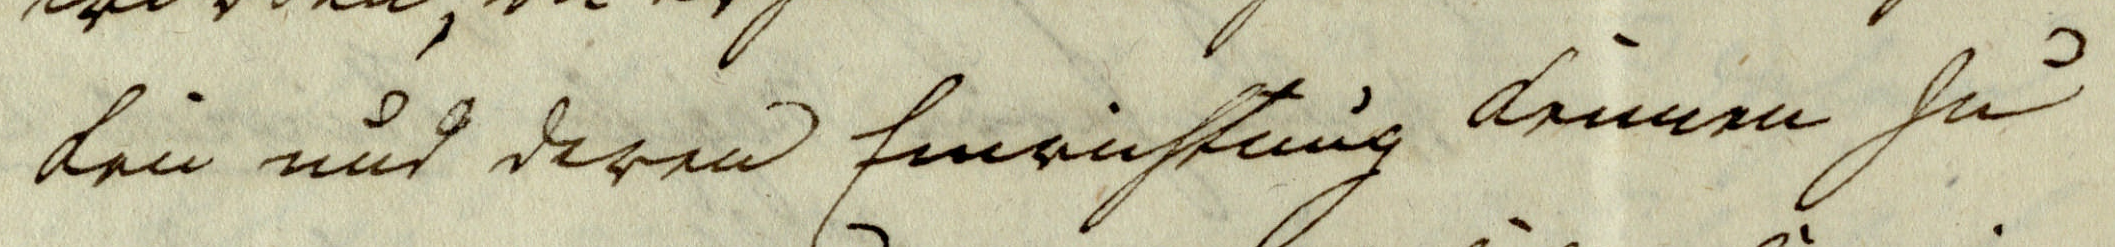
ken und deren Einrichtung kennen zu
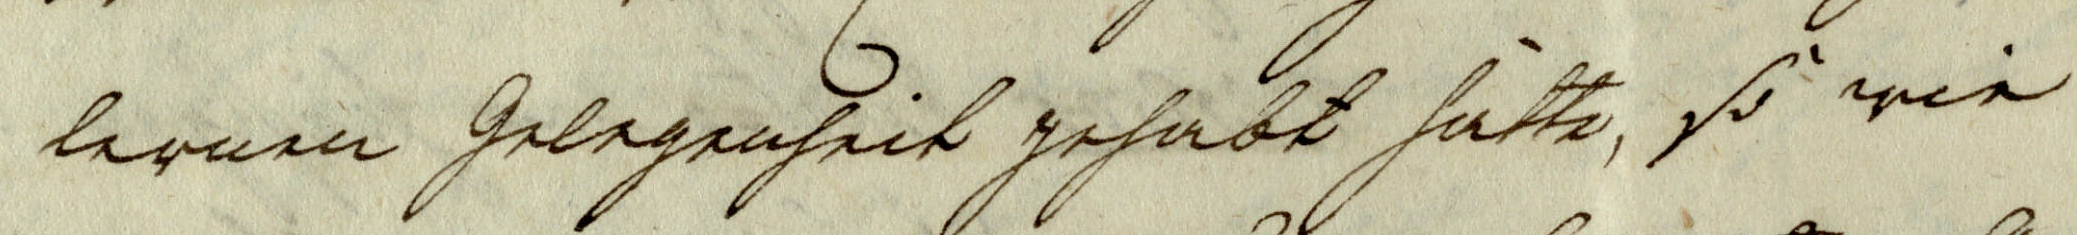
lernen Gelegenheit gehabt hätte, so wie
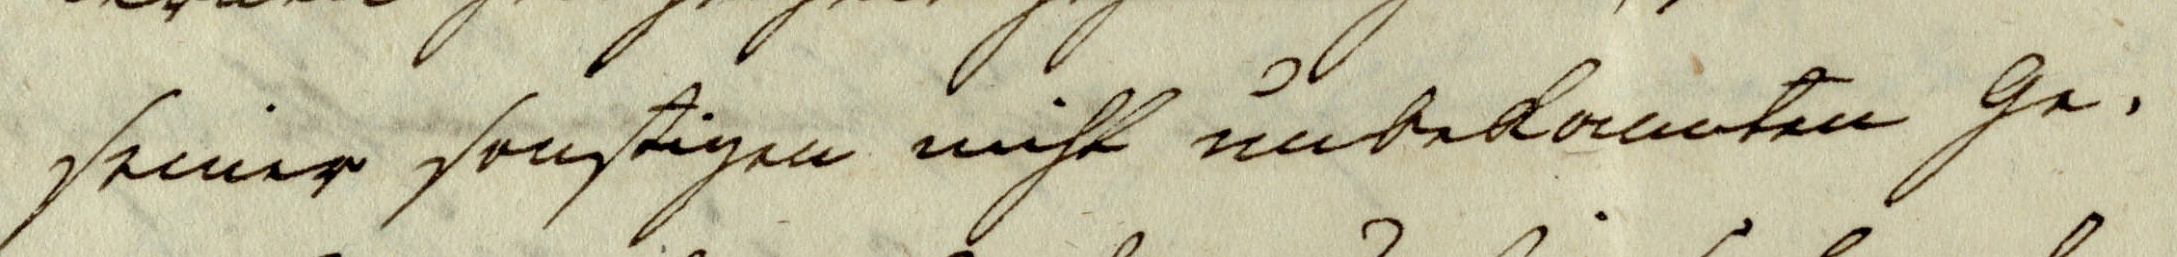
seiner sonstigen nicht unbekannten Ge¬
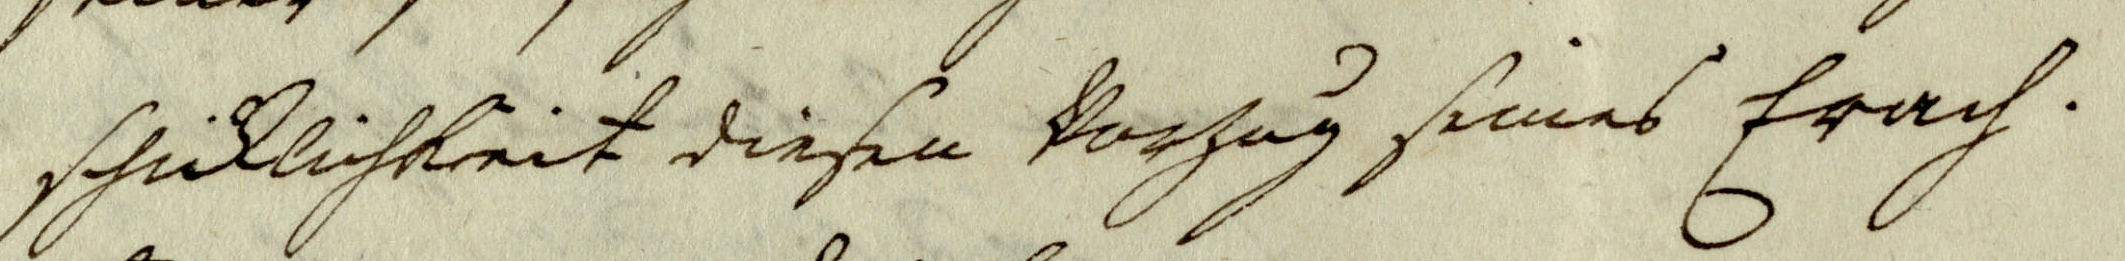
schicklichkeit diesen Vorzug seines Erach¬
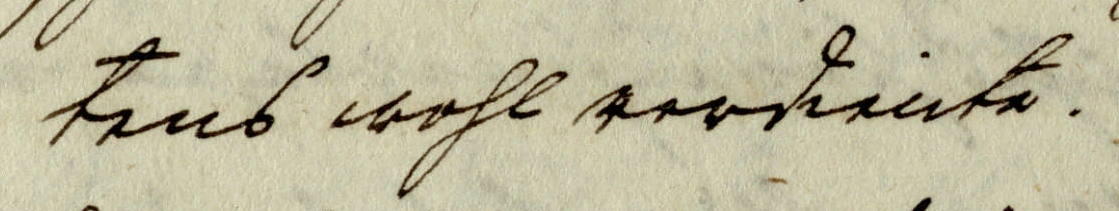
tens wohl verdiente.
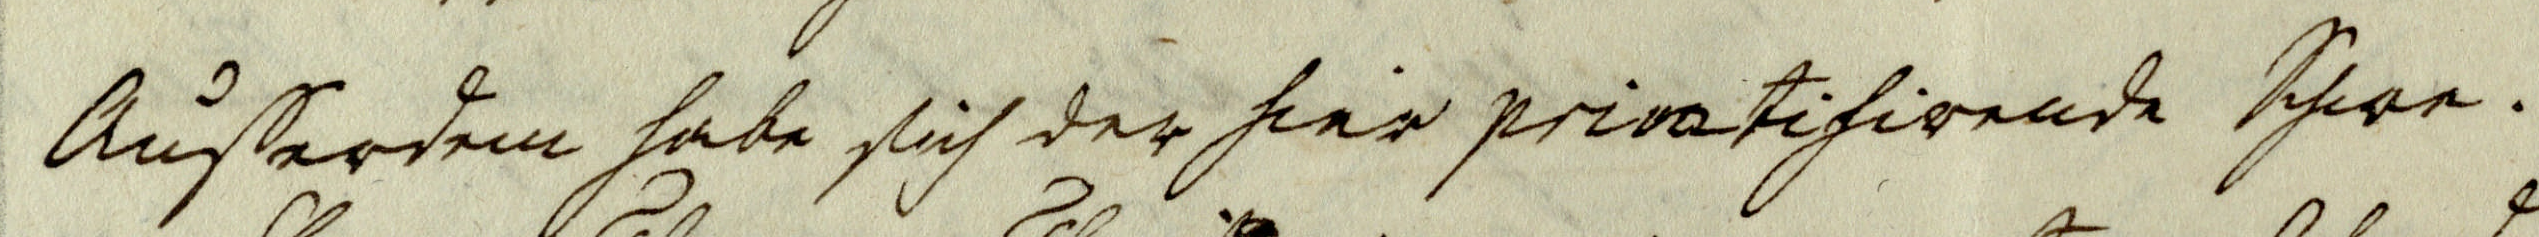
Ausserdem habe sich der hier privatisirende Schwe¬
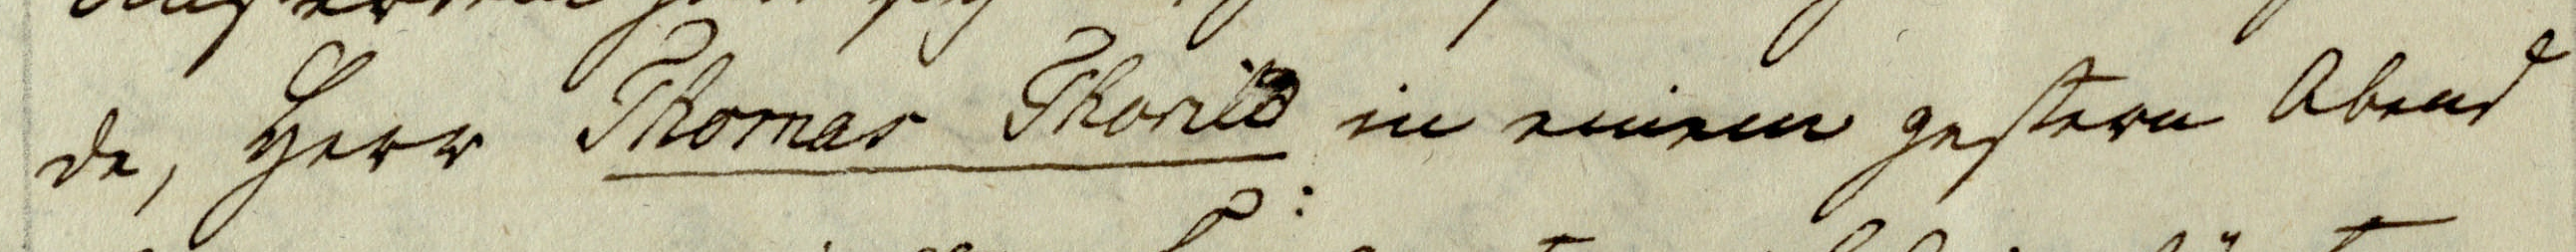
de, Herr Thomas Thorild in einem gestern Abend
